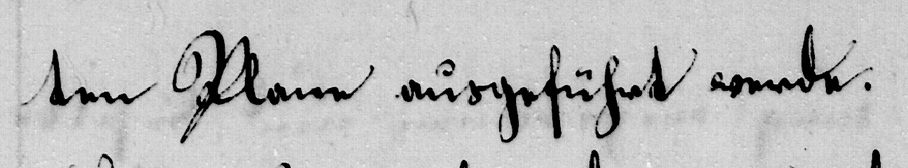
ten Plane ausgeführt werde.
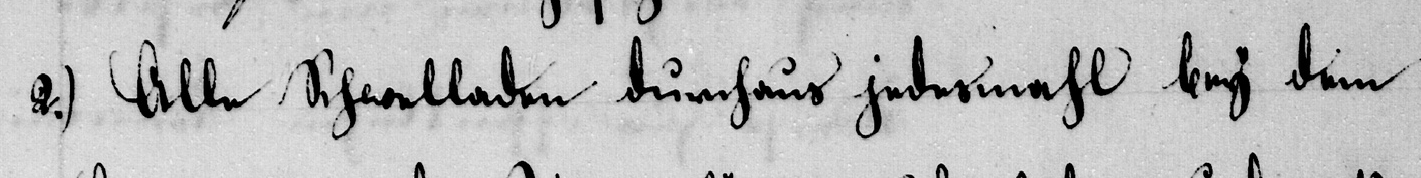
2.) Alle Schwelladen durchaus jedesmahl bey dem
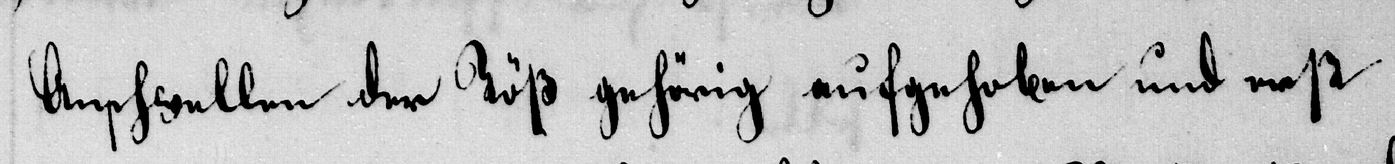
Anschwellen der Töß gehörig aufgehoben und erst
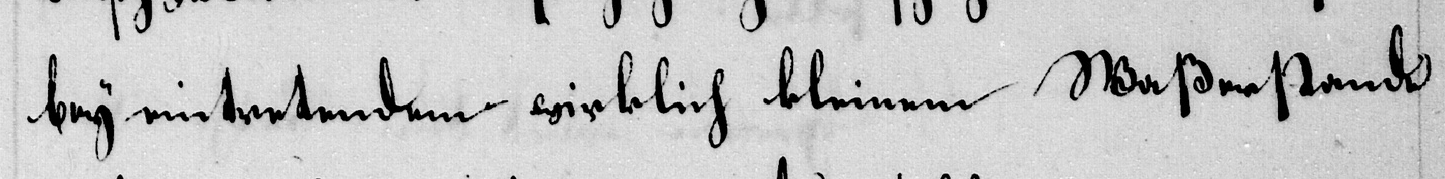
bey eintretendem wirklich kleinen Waßerstande
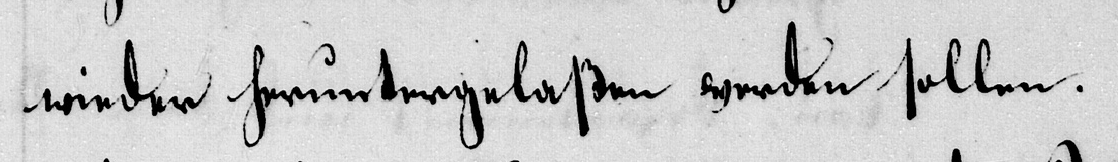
wieder heruntergelaßen werden sollen.
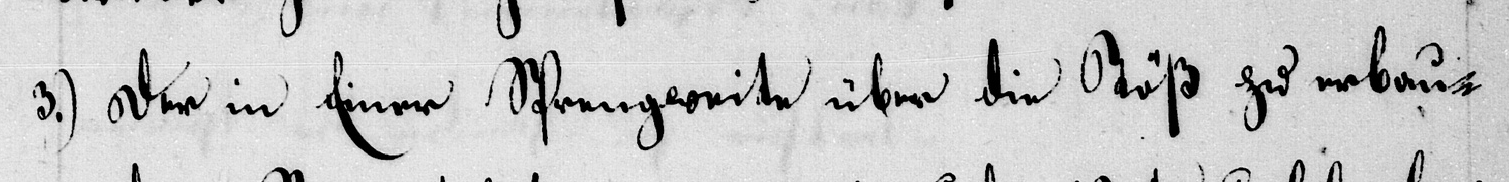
3.) Der in Einer Sprengweite über die Töß zu erbau¬
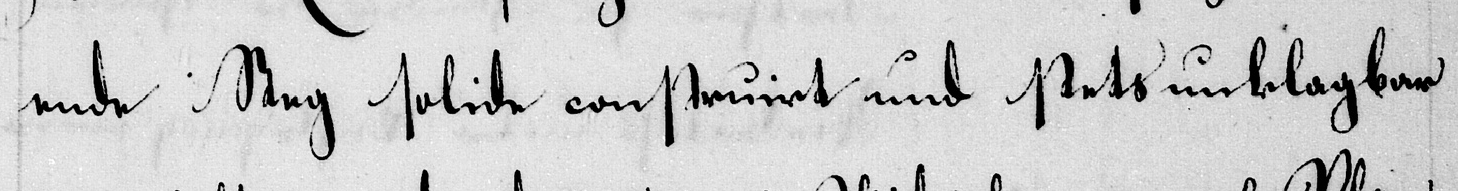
ende Steg solide construirt und stets unklagbar
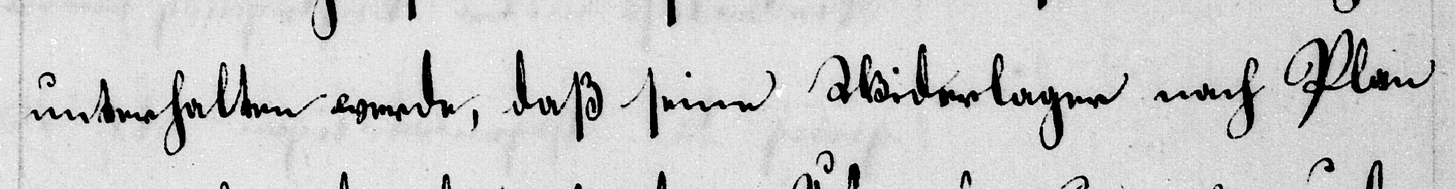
unterhalten werde, daß seine Widerlager nach Plan
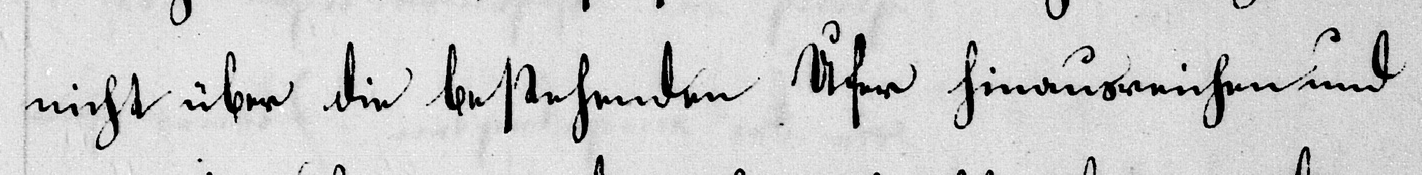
nicht über die bestehenden Ufer hinausreichen und
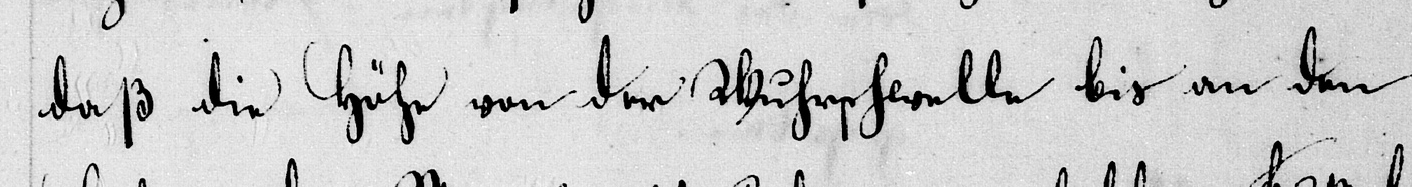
daß die Höhe von der Wuhrschwelle bis an den
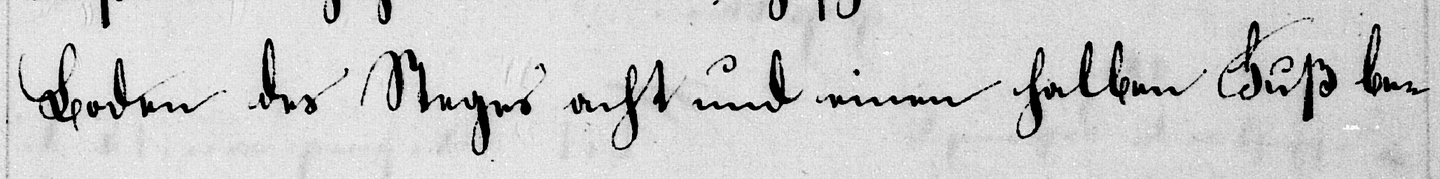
Boden des Steges acht und einen halben Fuß be¬
